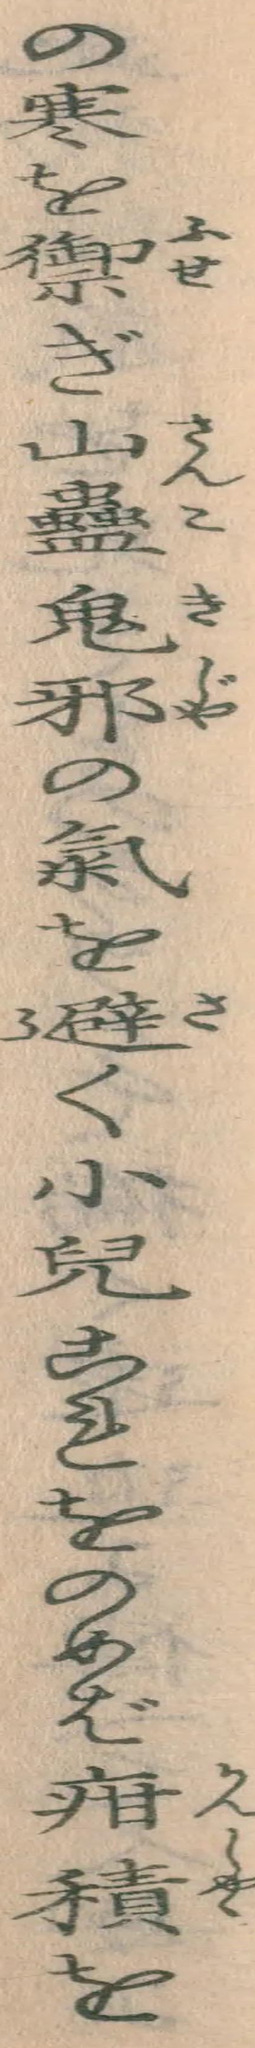の寒を禦ぎ山蠱鬼邪の気を避く小児これをのめば疳積を
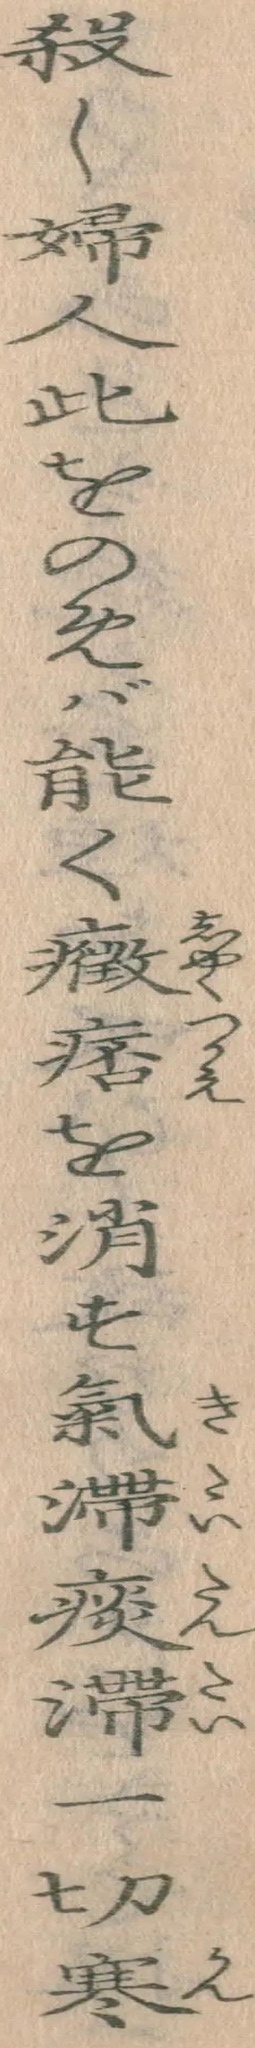殺し婦人此をのめば能く癥痞を消す気滞痰滞一切寒
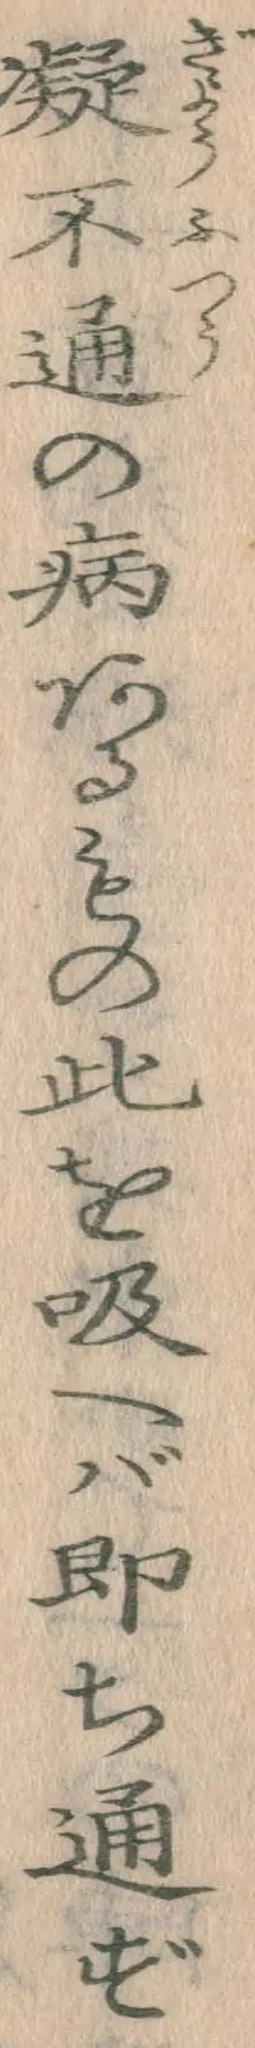凝不通の病あるもの此を吸へば即ち通ず
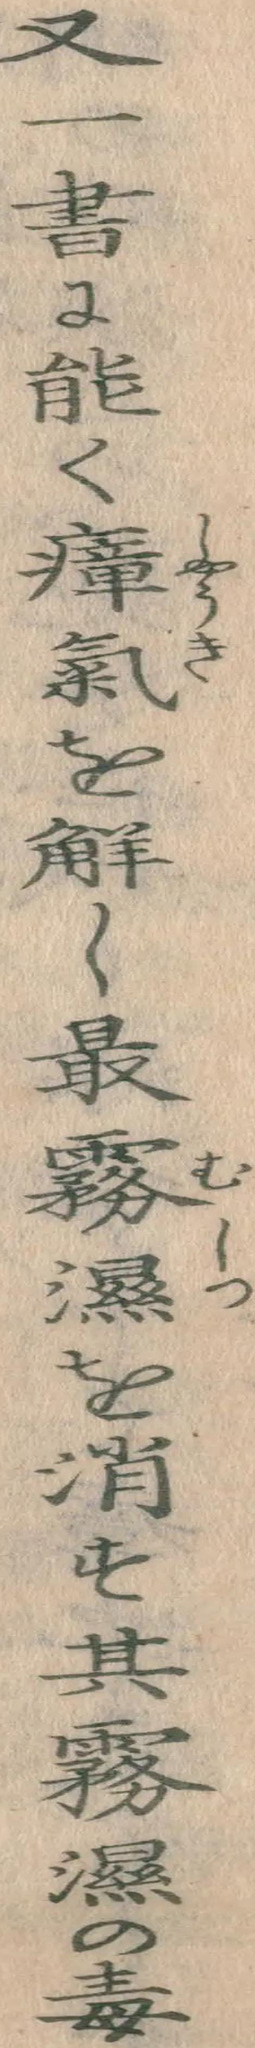又一書に能く瘴気を解し最霧湿を消す其霧湿の毒
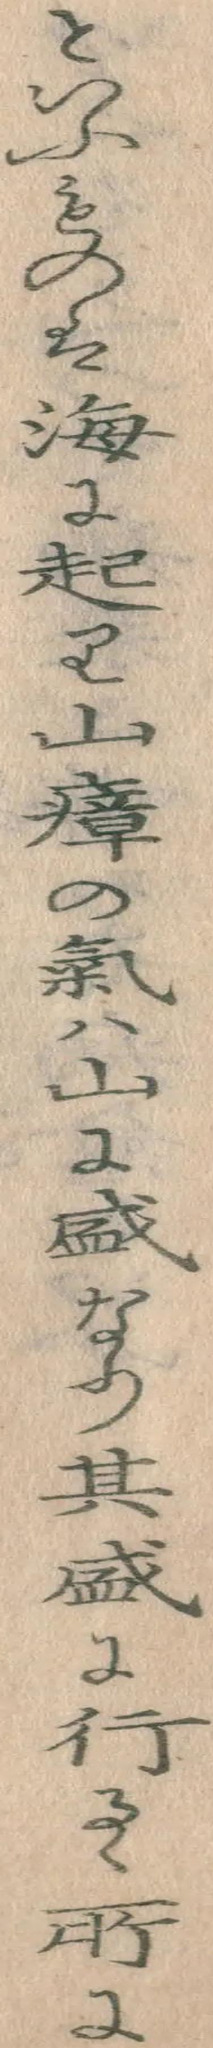といふものは海に起り山瘴の気は山に盛なり其盛に行るゝ所に
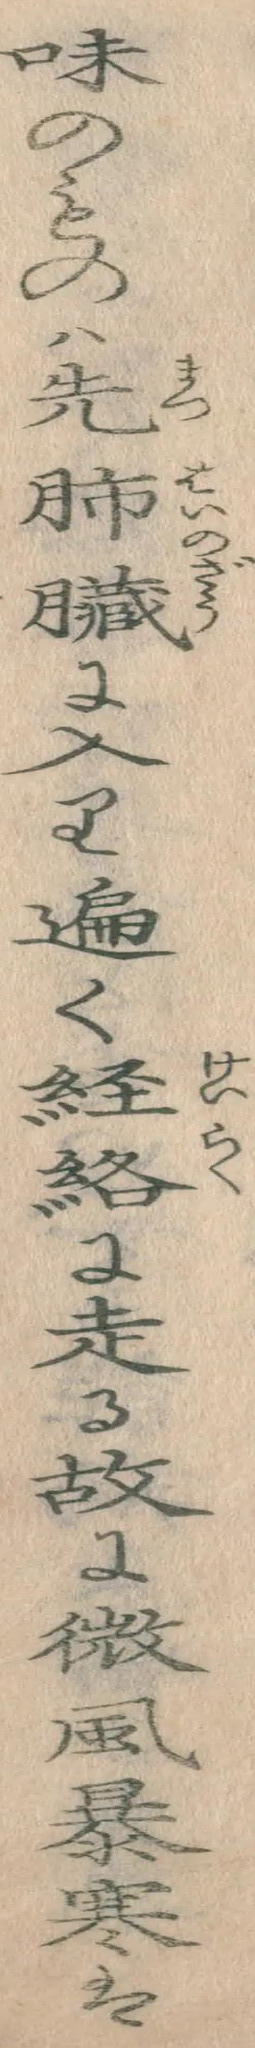味のものは先肺臓に入り遍く経絡に走る故に微風暴寒は
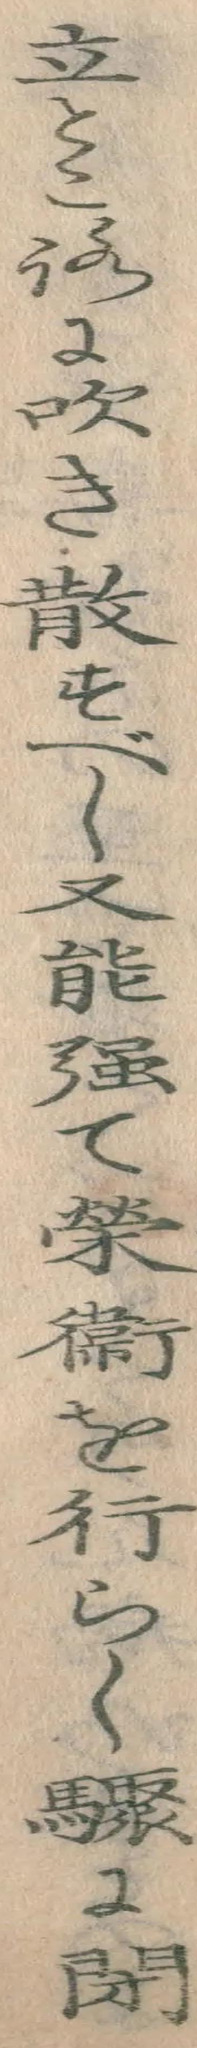立ところに吹き散すべし又能強て栄衛を行らし驟に閉
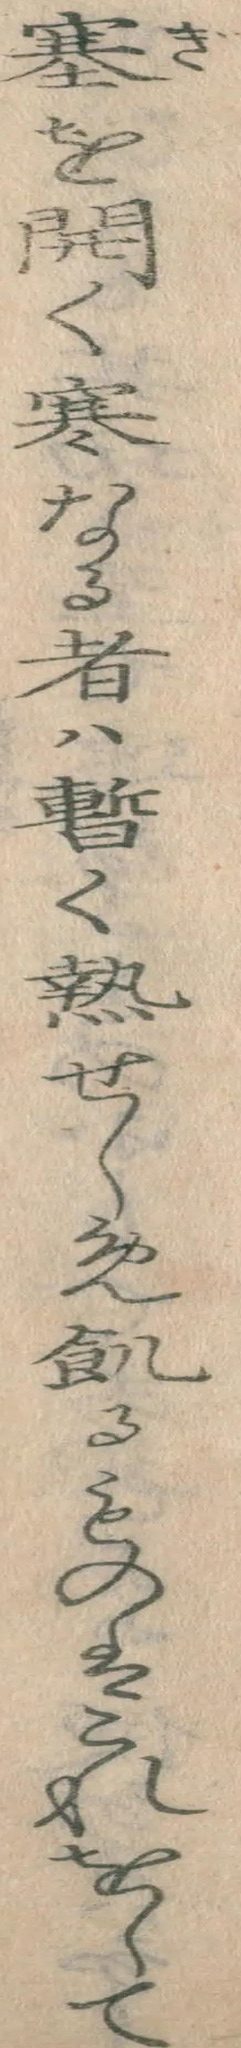塞を開く寒なる者は暫く熱せしめ飢るものはこれをして
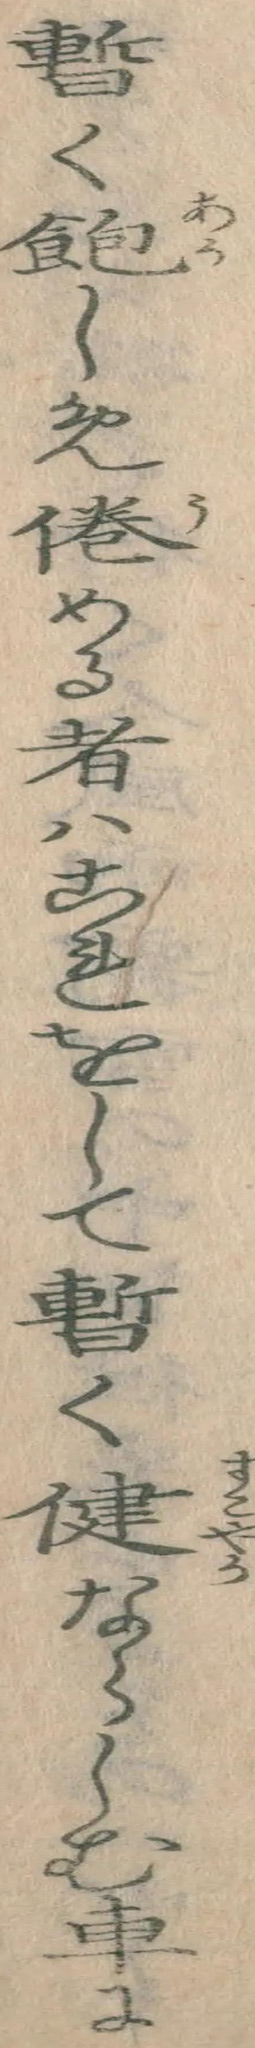暫く飽しめ倦める者はこれをして暫く健ならしむ車に

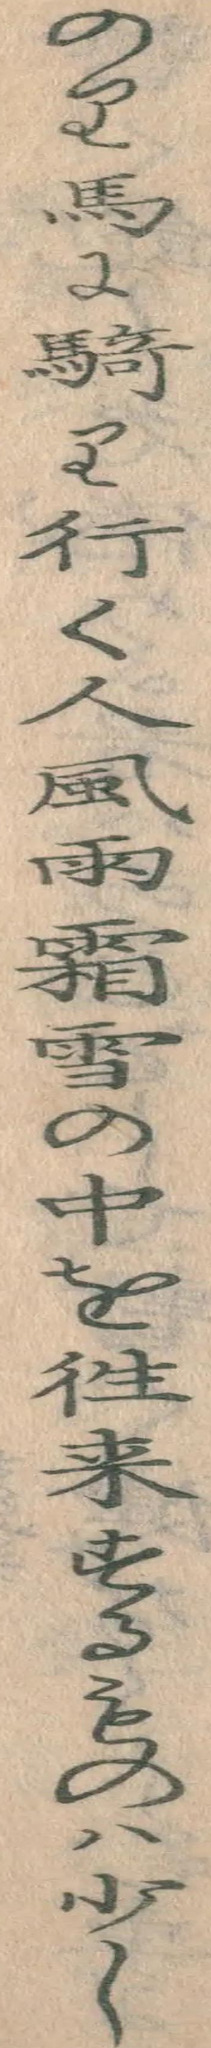のり馬に騎り行く人風雨霜雪の中を往来するものは少し
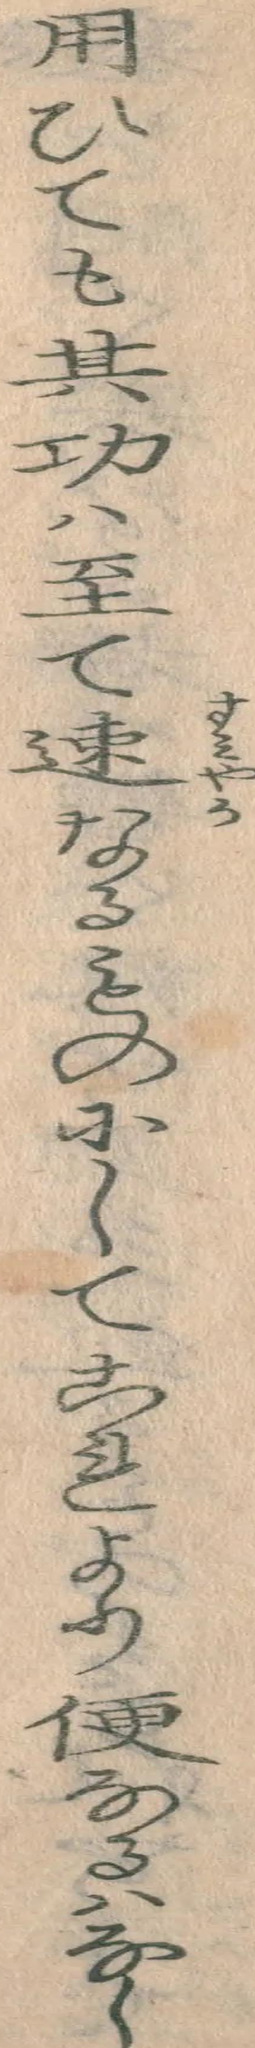用ひても其功は至て速なるものにしてこれより便なるはなし
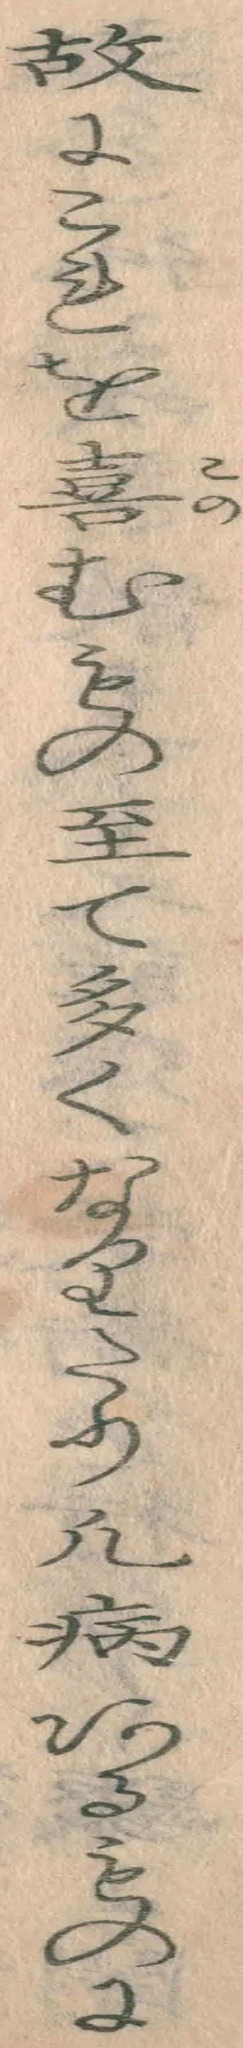故にこれを喜むもの至て多くなりたり凡病あるものに
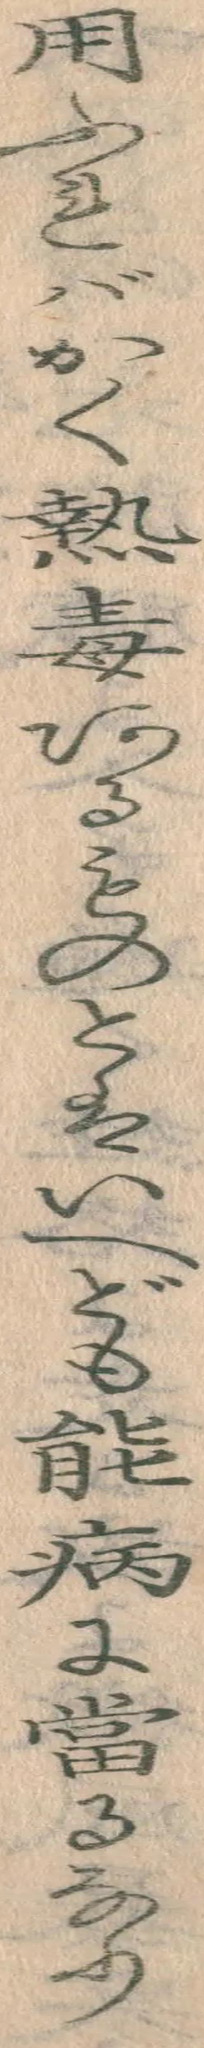用ふればかく熱毒あるものとはいへども能病に当たるなり
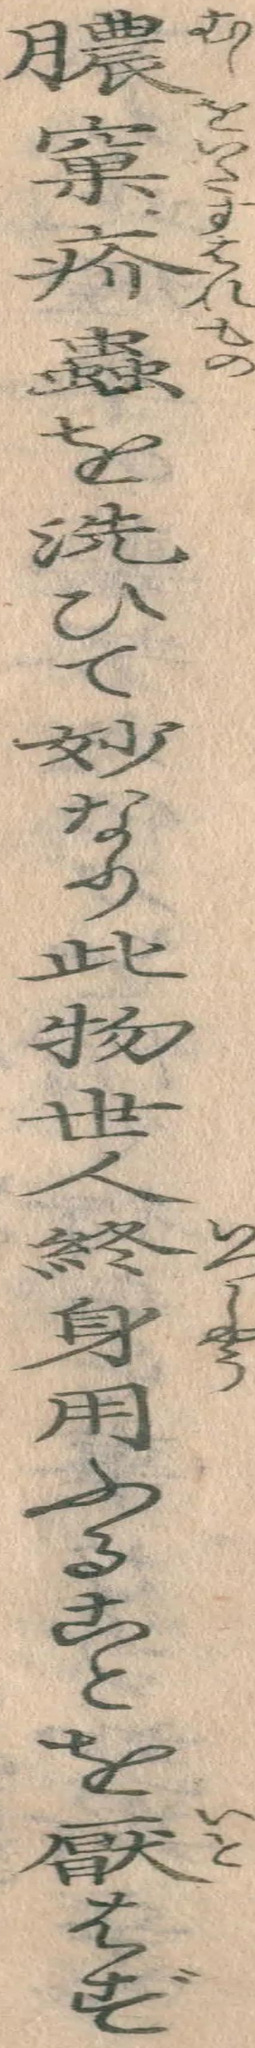膿窠疥虫を洗ひて妙なり此物世人終身用ふることを厭はず
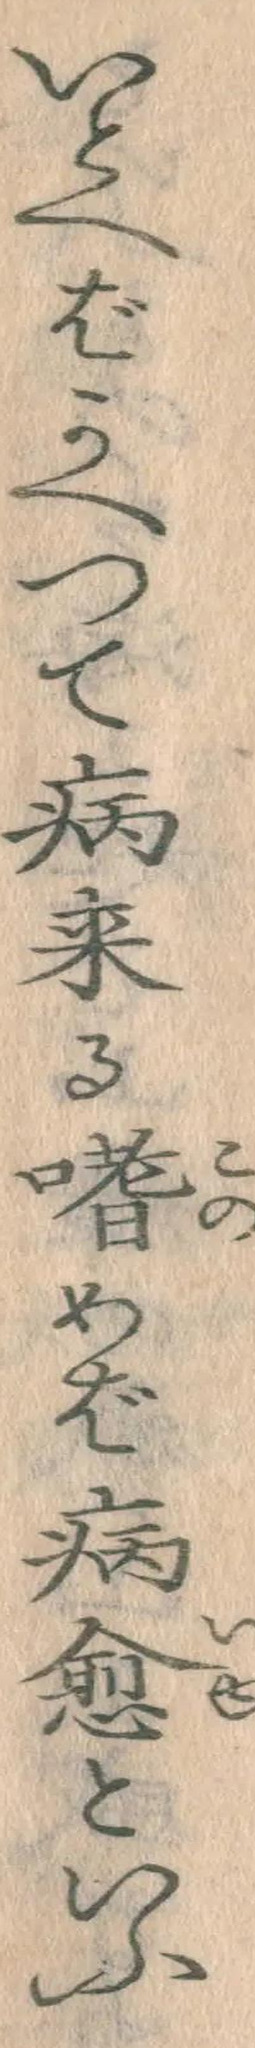いとへばかへつて病来る嗜めば病愈といふ
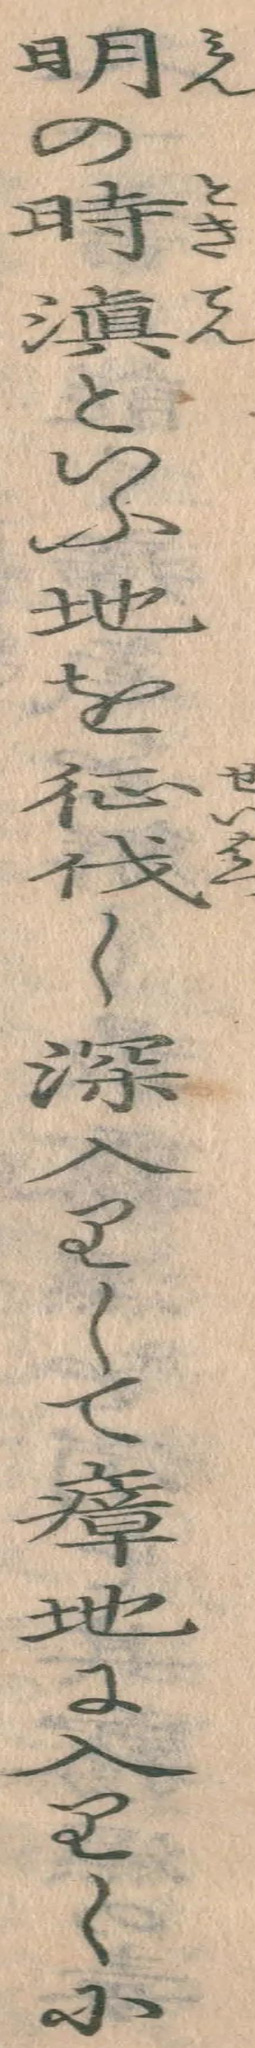明の時滇といふ地を征伐し深入りして瘴地に入りしに
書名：目さまし草
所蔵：国立国会図書館 National Diet Library, JAPAN
